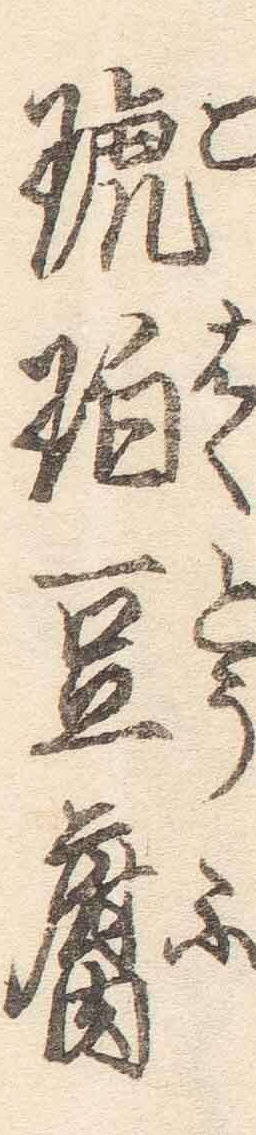琥珀豆腐
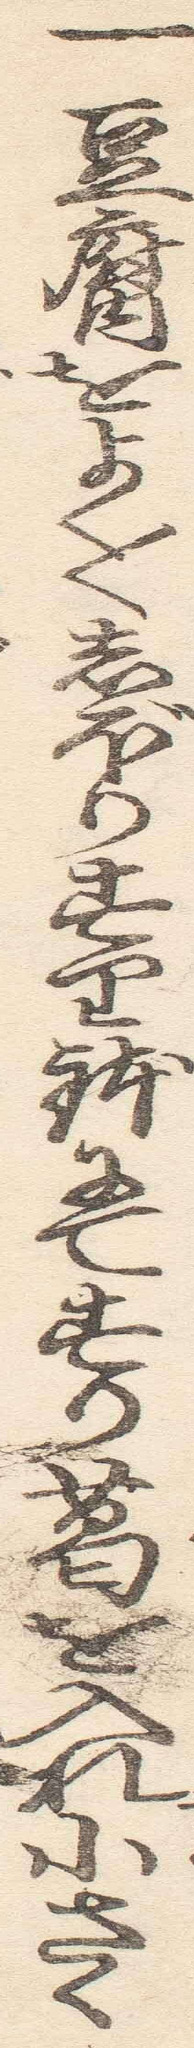一豆腐をよく〳〵しぼりすり鉢にてすり葛を入れ小さく
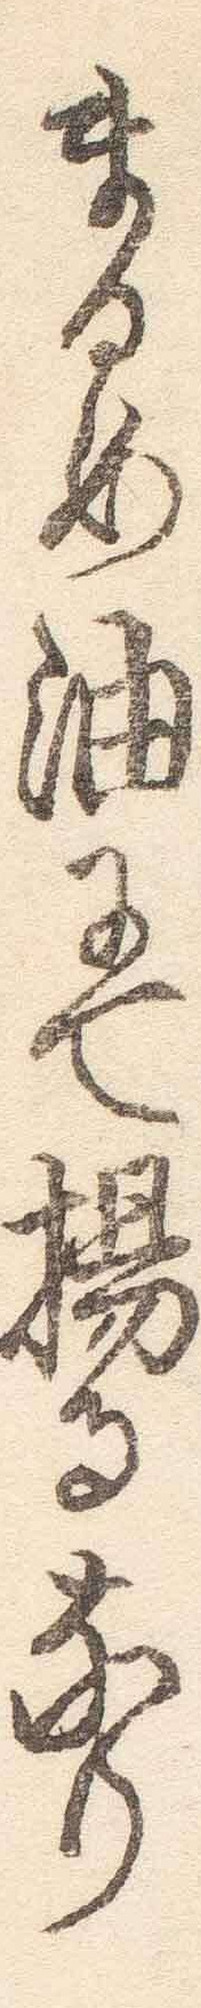まるめ油にて揚るなり
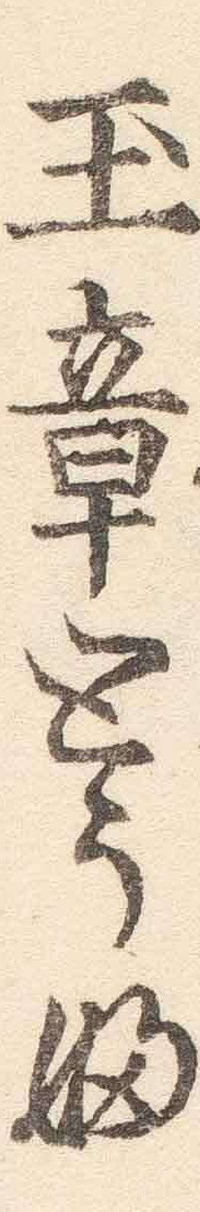玉章とうふ
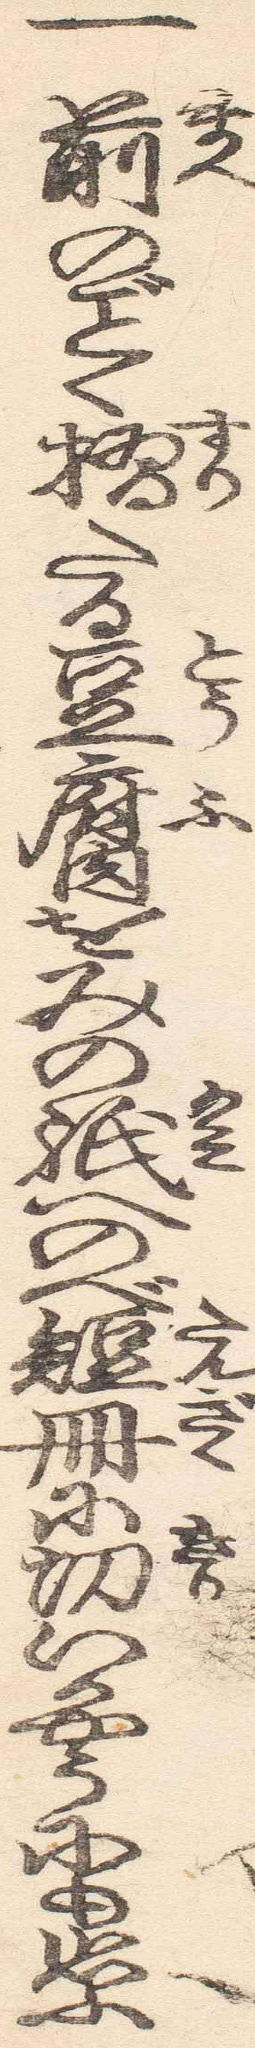一前のごとく摺たる豆腐をみの紙へのべ短冊に切いかやうにも思ふ
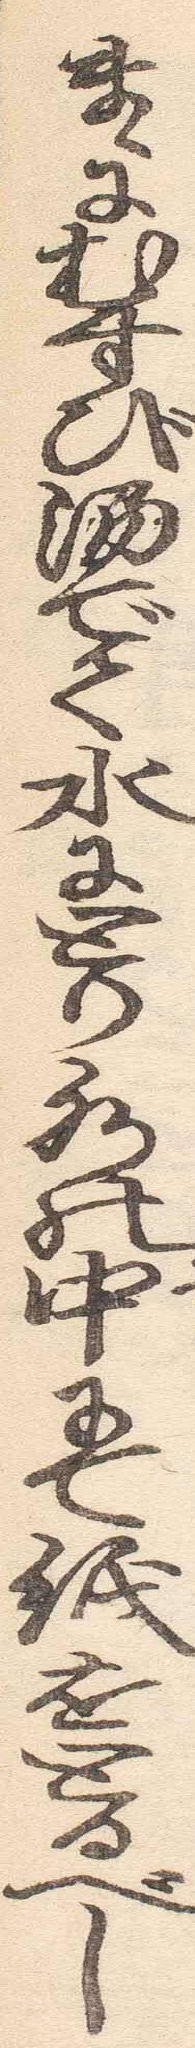まゝにむすび湯でて水にとり水の中にて紙をとるべし
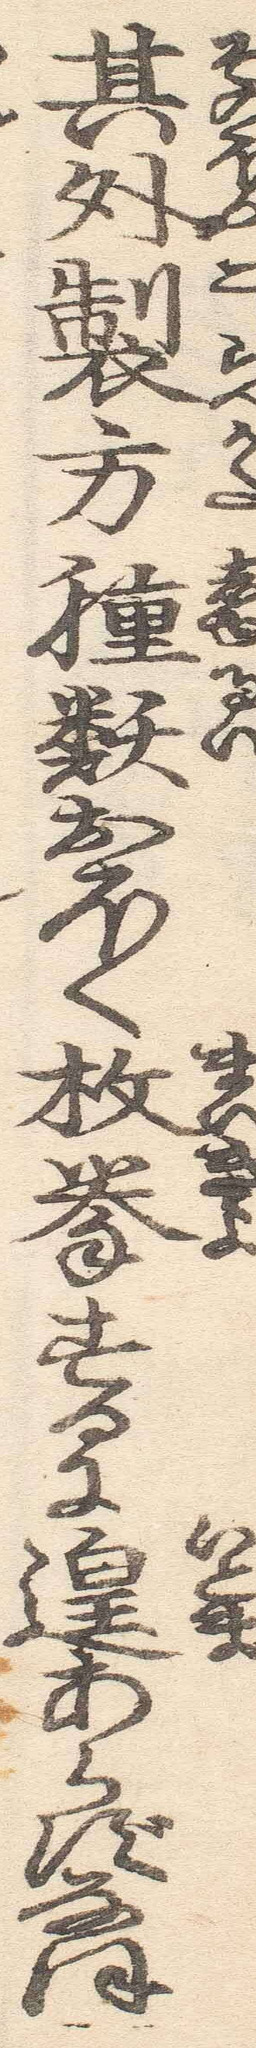其外製方種類おほく枚挙するに遑あらずなほ
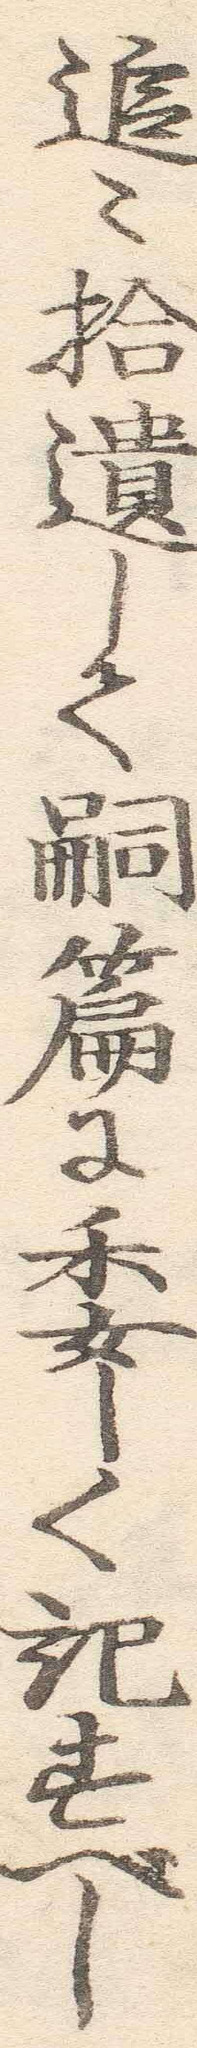追々拾遺して嗣篇に委しく記すべし
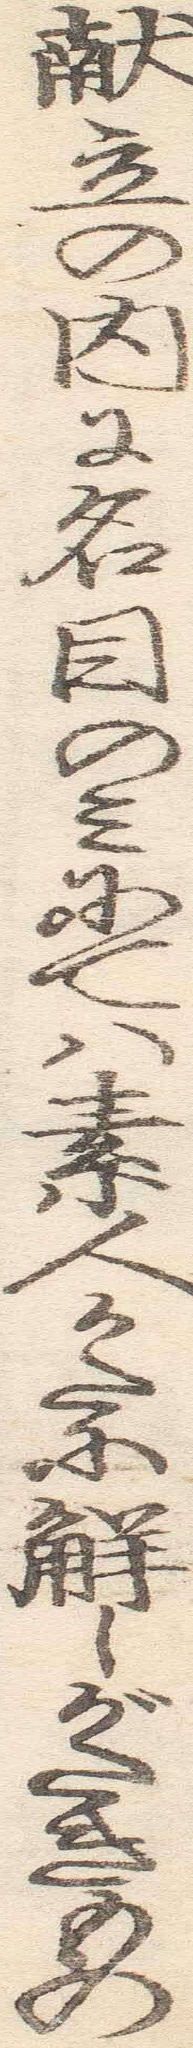献立の内に名目のみにては素人かたに鮮しがたきもの
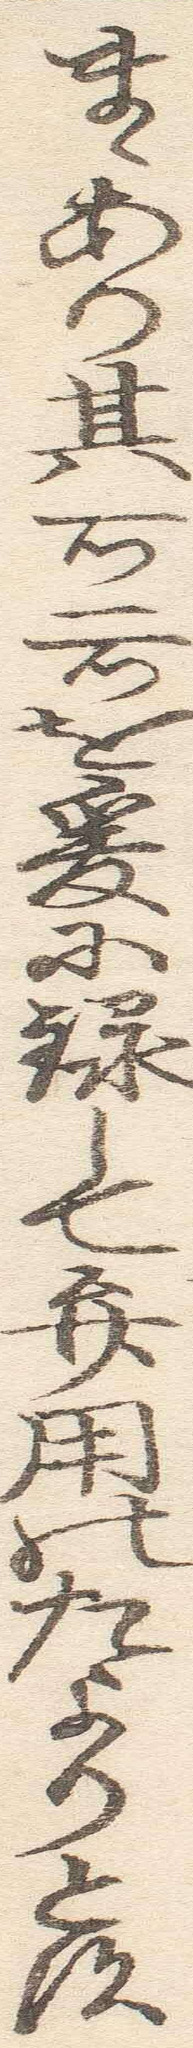まゝあり其一つ二つを爰に録して弁用のたよりとす

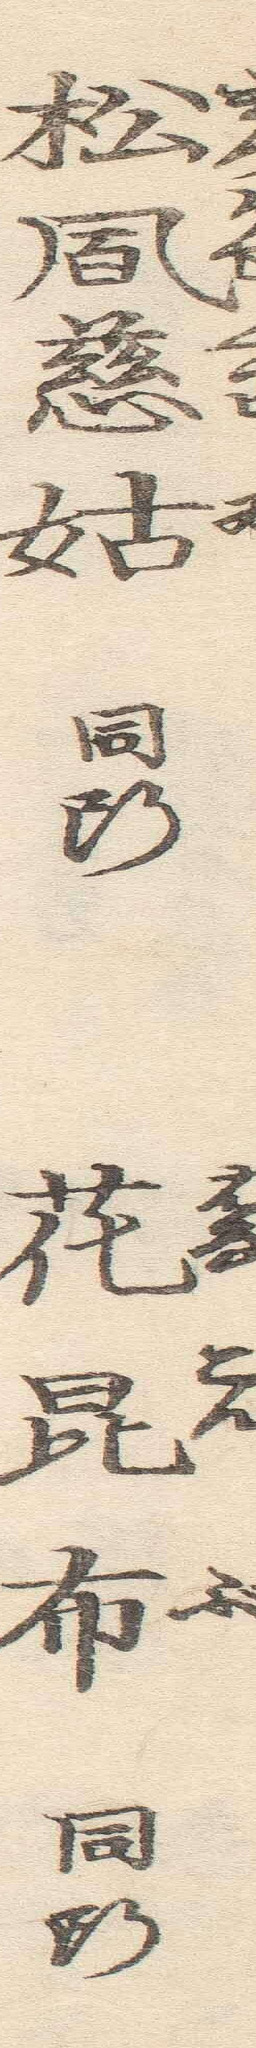松風慈姑同断花昆布同断
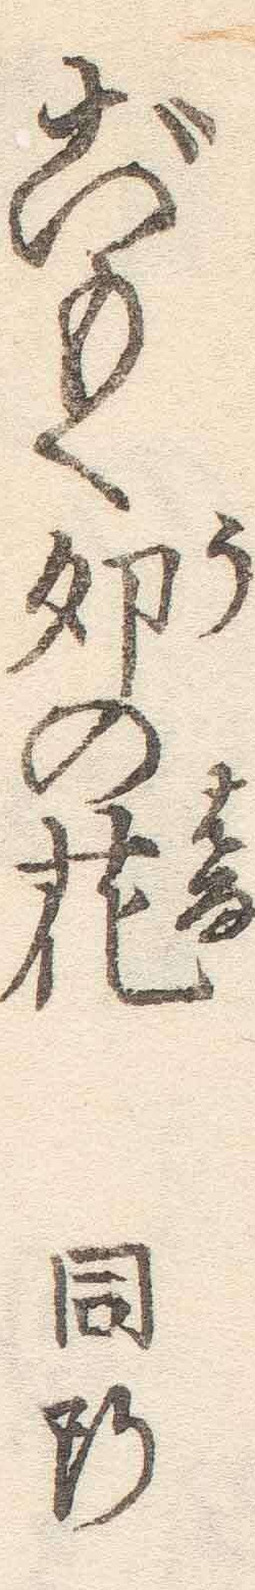ごもく卯の花同断
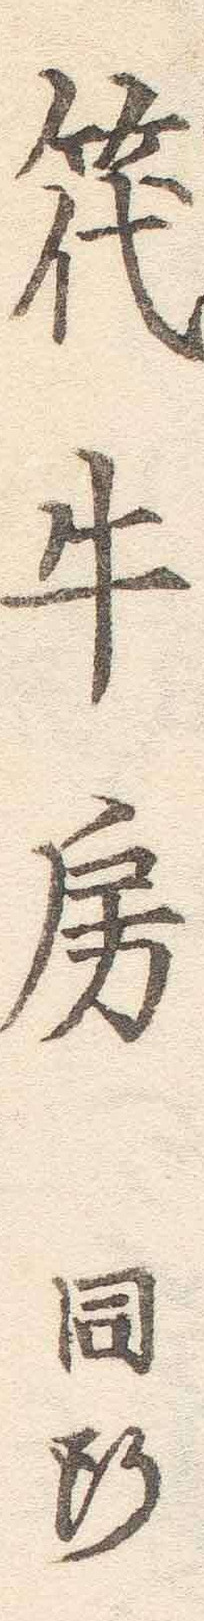筏牛蒡同断
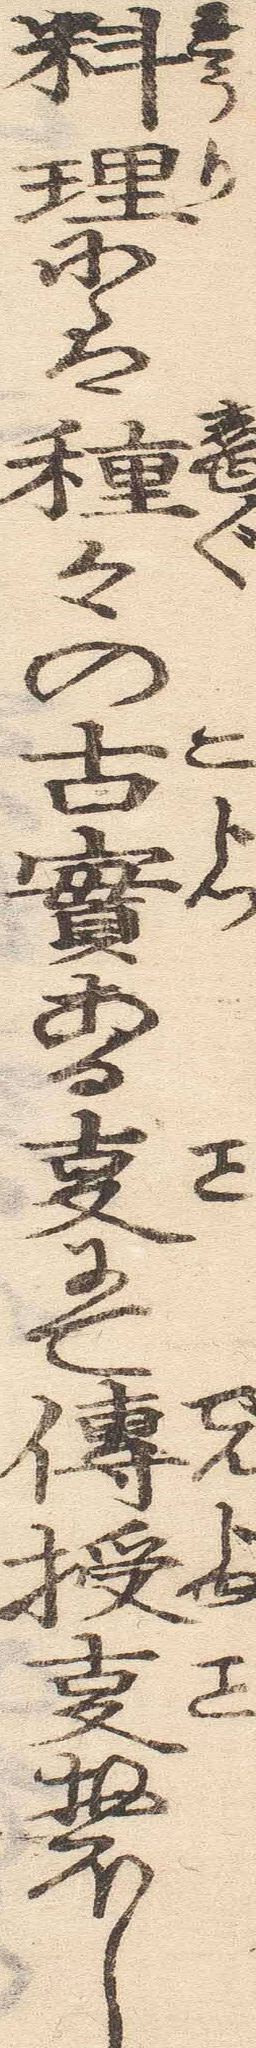料理には種々の古実ある事にて伝授事おほし
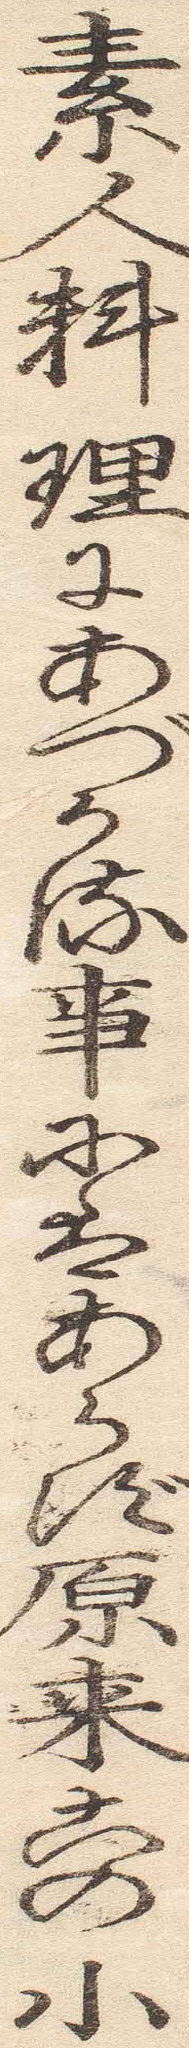素人料理にあづかる事にはあらず原来この小
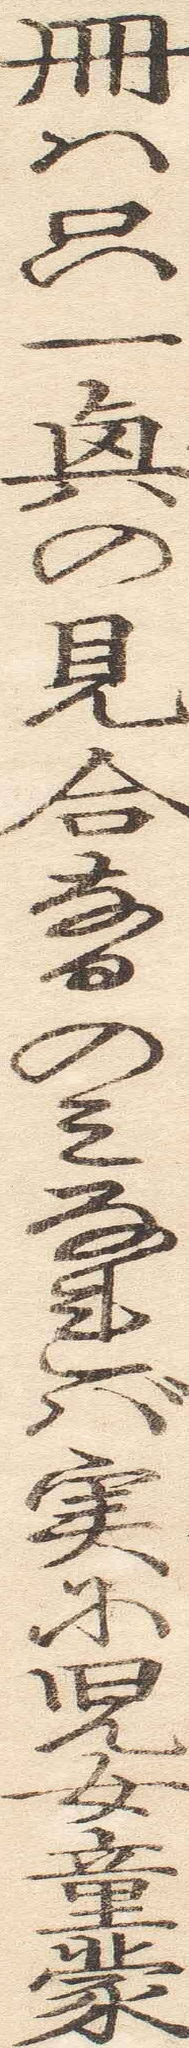冊は只一興の見合なるのみなれば実に児女童蒙
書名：料理通
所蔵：東京学芸大学附属図書館 国文学研究資料館
